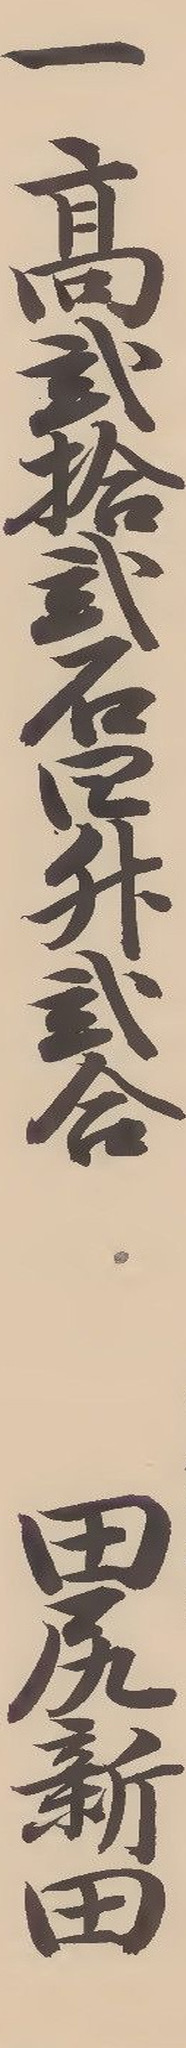一高弐拾弐石四升弐合田尻新田

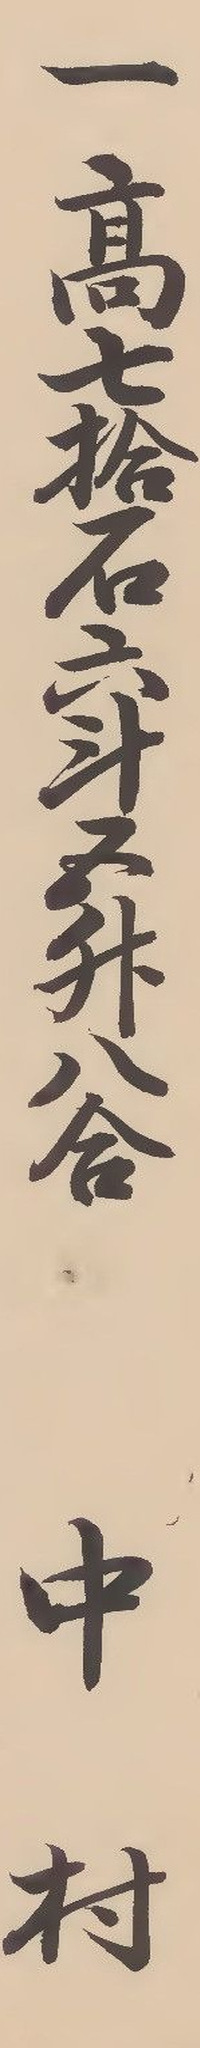一高七拾石六斗五升八合中村
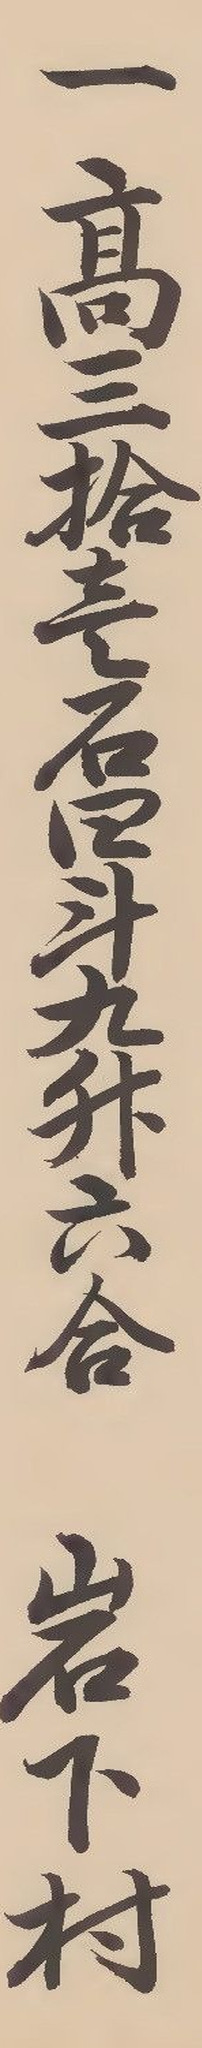一高三拾壱石四斗九升六合岩下村
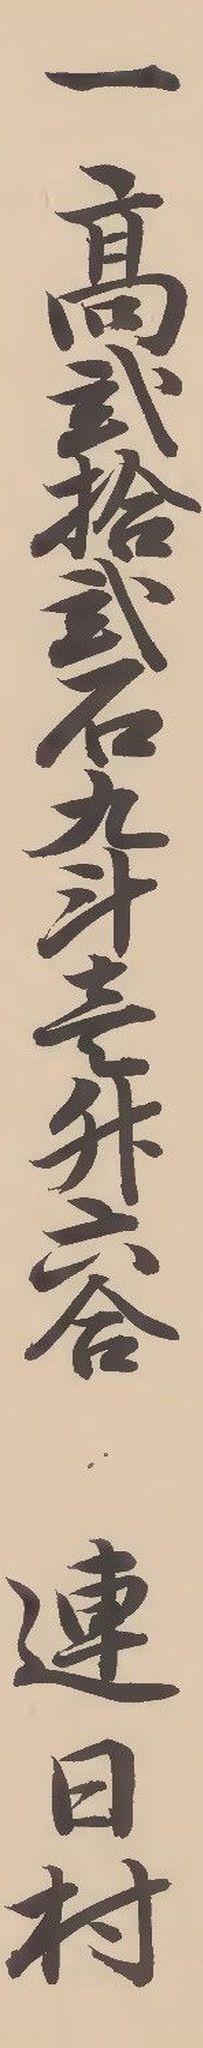一高弐拾弐石九斗壱升六合連日村
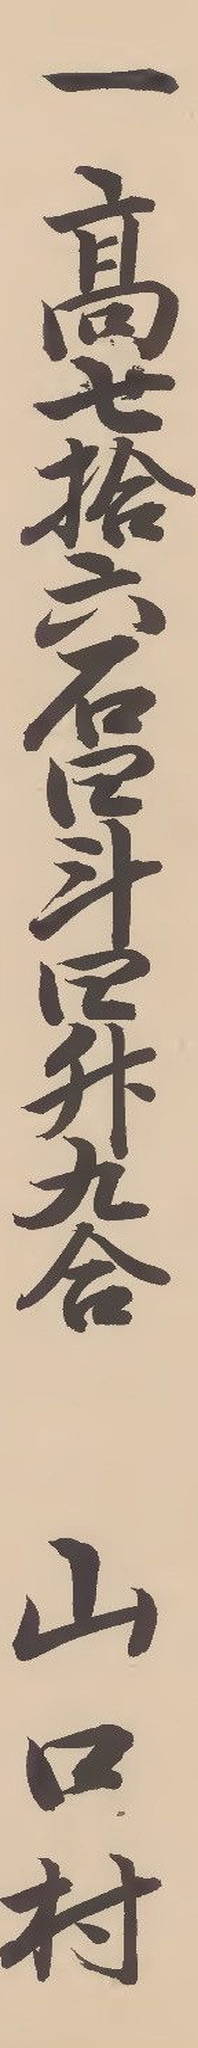一高七拾六石四斗四升九合山口村
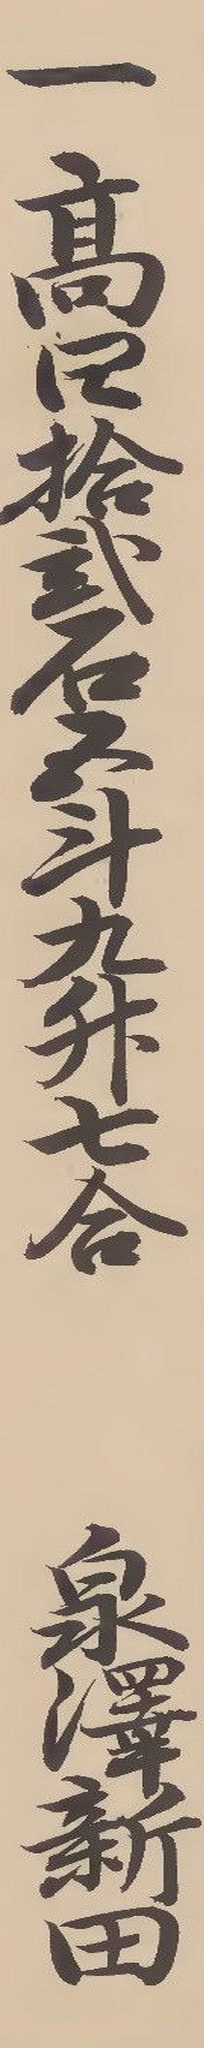一高四拾弐石五斗九升七合泉沢新田
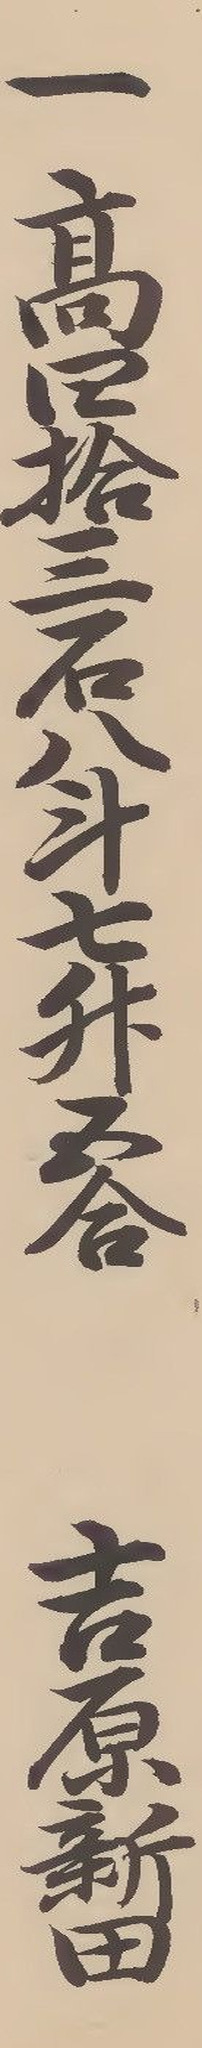一高四拾三石八斗七升五合吉原新田
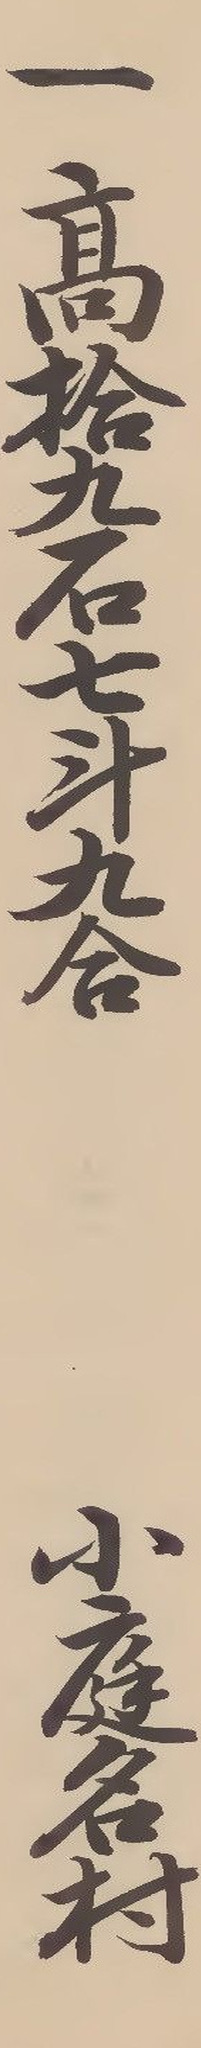一高拾九石七斗九合小庭名村
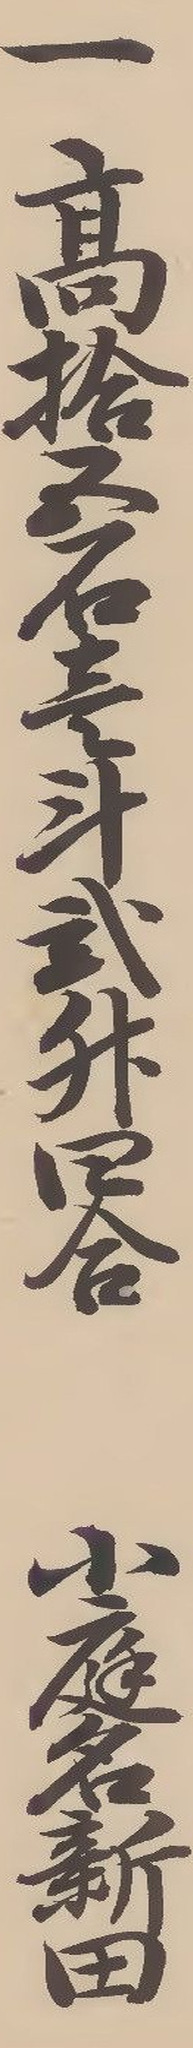一高拾五石壱斗弐升四合小庭名新田

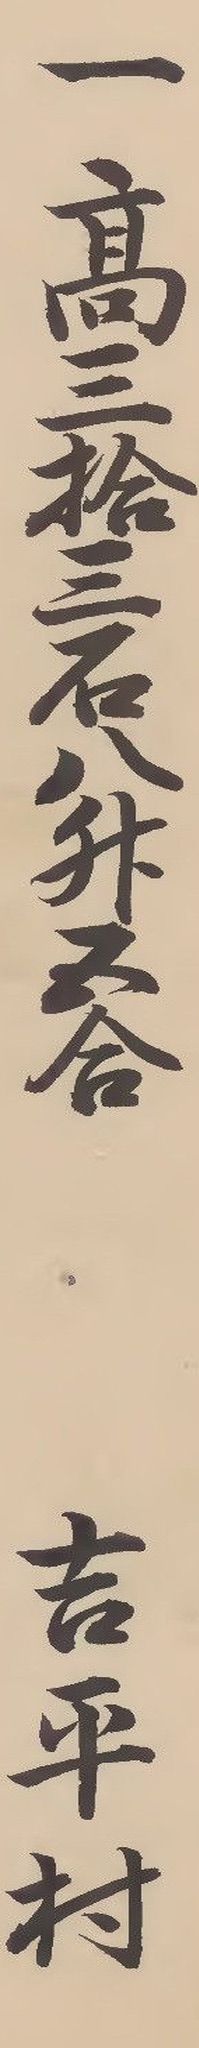一高三拾三石八升五合吉平村
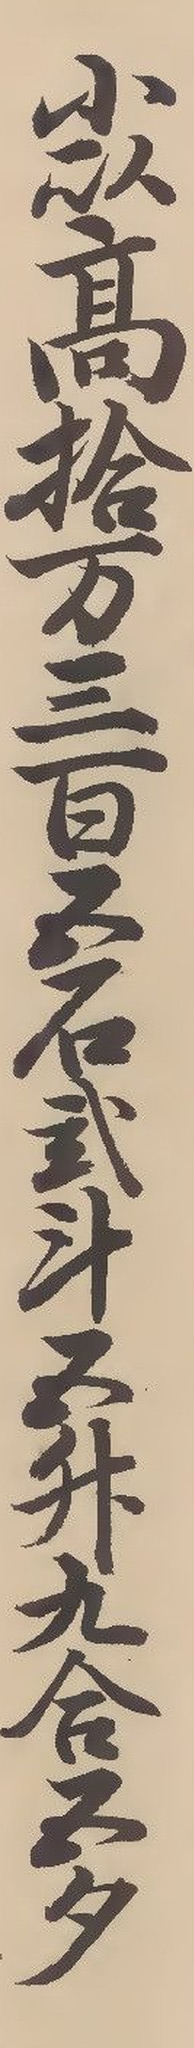小以高拾万三百五石弐斗五升九合五勺
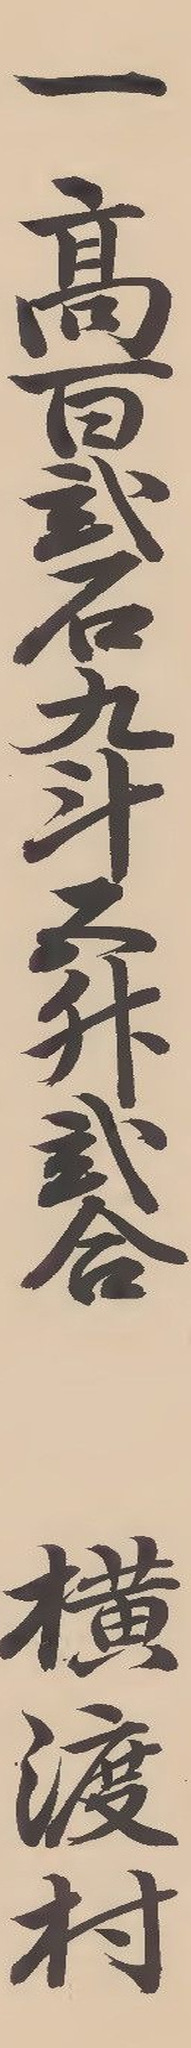一高百弐石九斗五升弐合横渡村
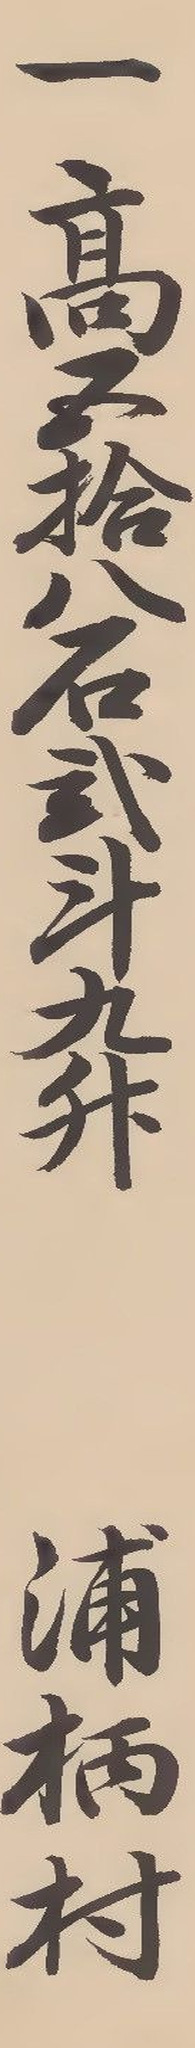一高五拾八石弐斗九升浦柄村
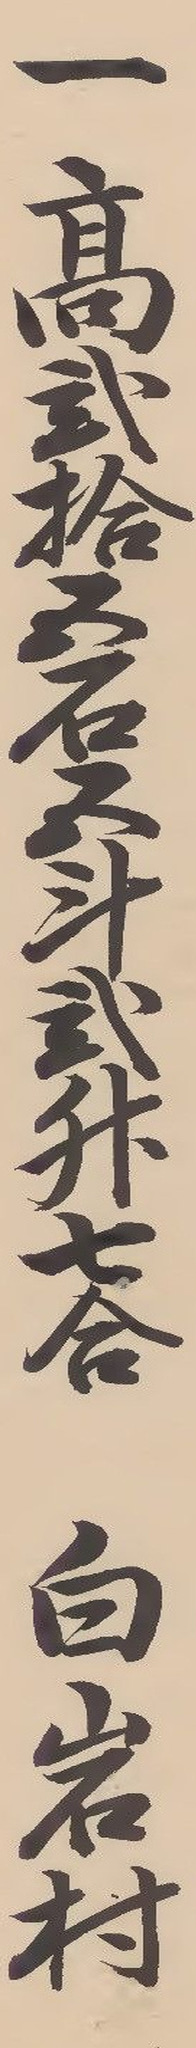一高弐拾五石五斗弐升七合白岩村

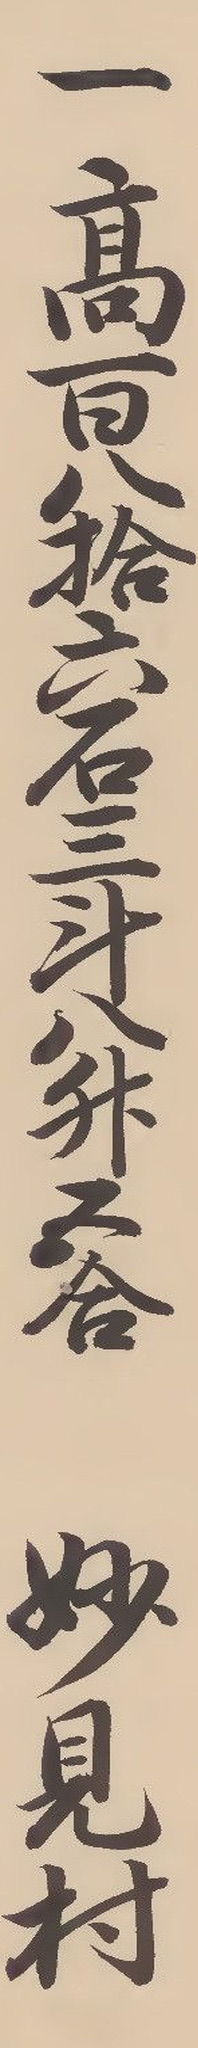一高百八拾六石三斗八升五合妙見村
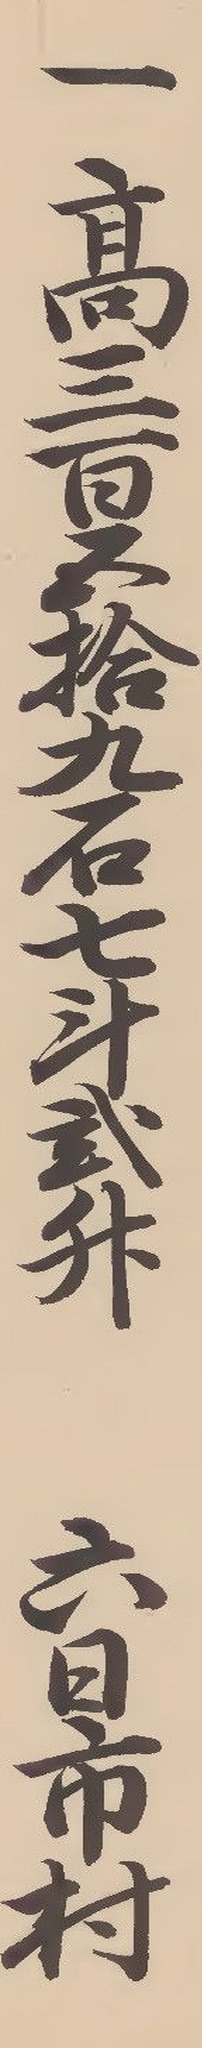一高三百五拾九石七斗弐升六日市村
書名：越後国郷帳　中
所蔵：国立公文書館 National Archives of Japan
